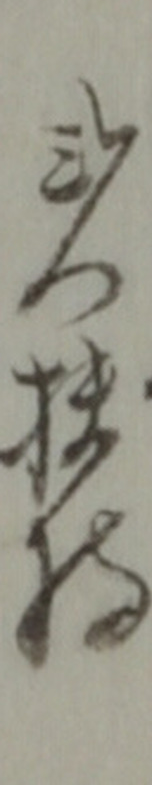弐人扶持
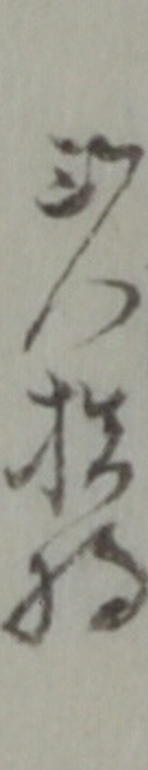弐人扶持
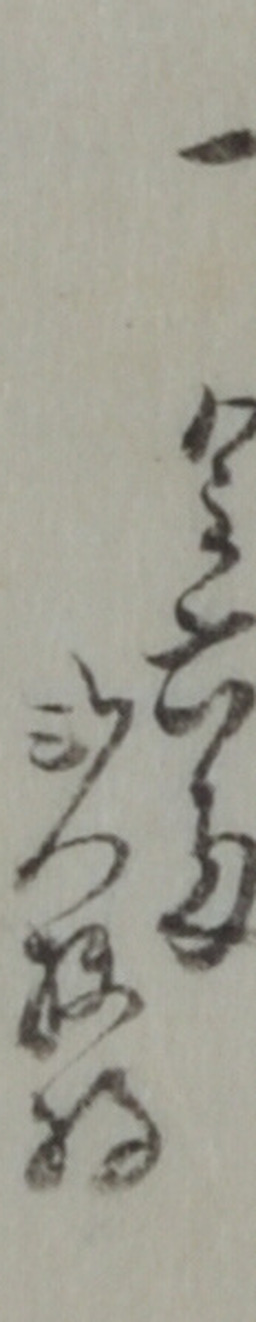弐人扶持
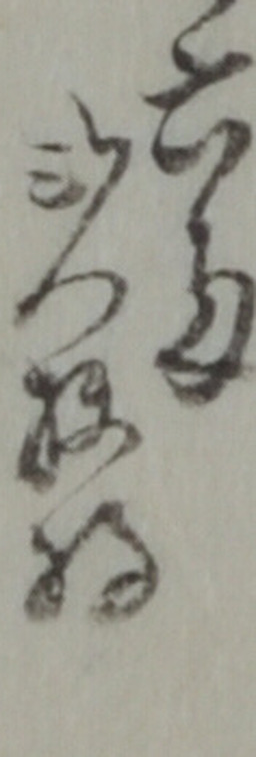弐人扶持
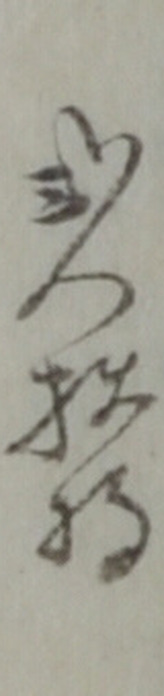弐人扶持

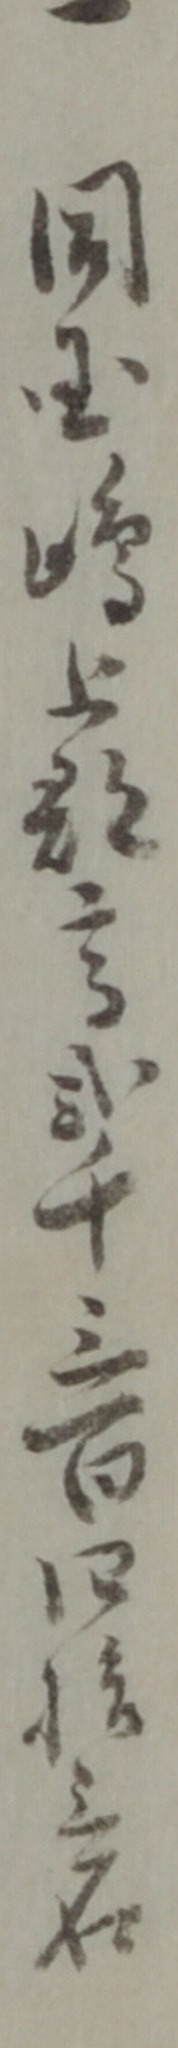一同国嶋上郡高弐千三百四拾三石
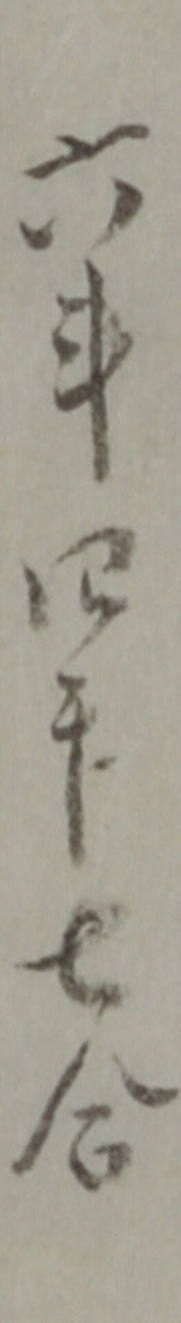六斗四升七合
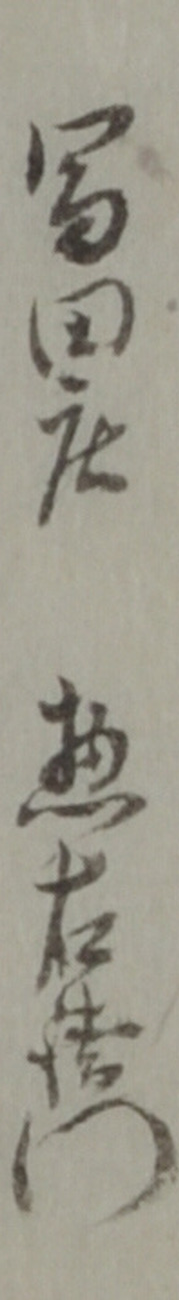冨田庄惣右衛門
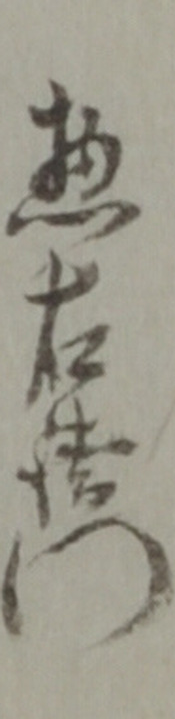七右衛門
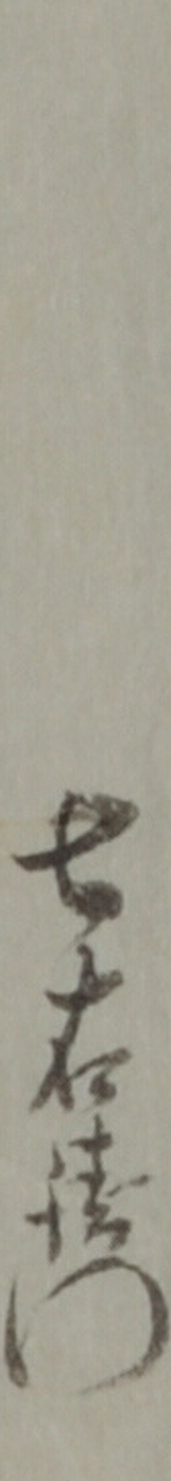七右衛門
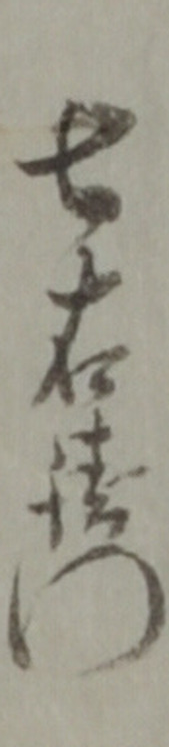七右衛門
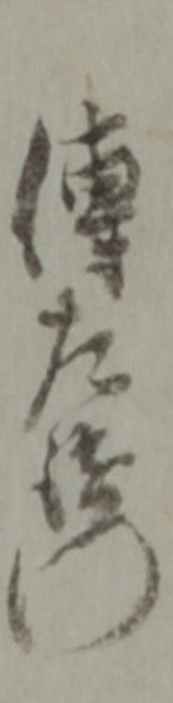伝左衛門
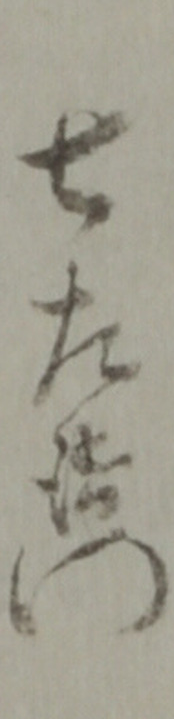七左衛門
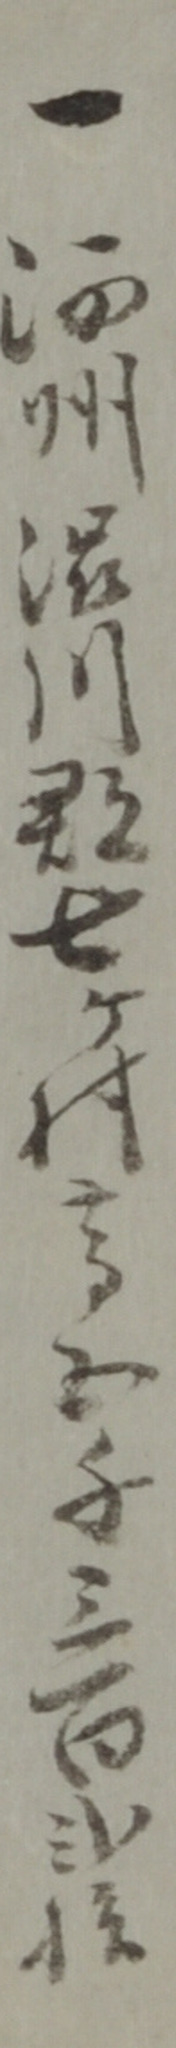一河州渋川郡七ケ村高五千三百弐拾
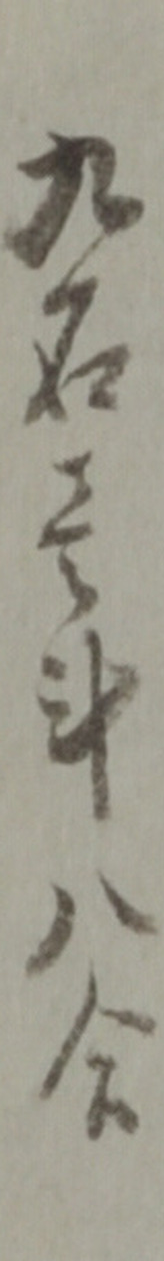九石壱斗八合
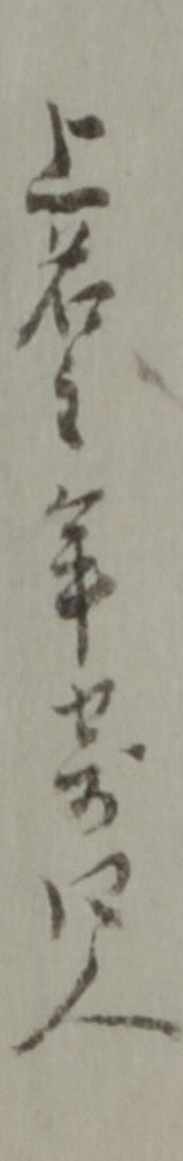上名主年寄四人
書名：内藤重頼公御代分限帳（写）
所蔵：伊那市立高遠町図書館・合同会社AMANE
